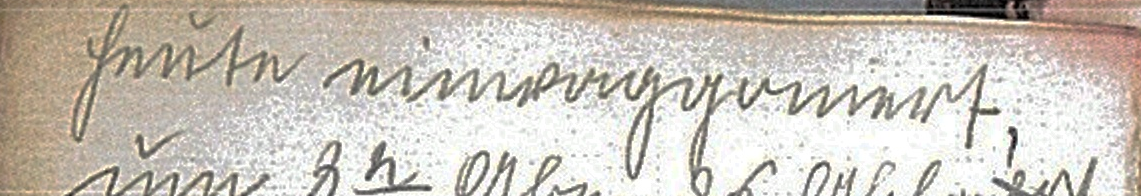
heute einwaggoniert,
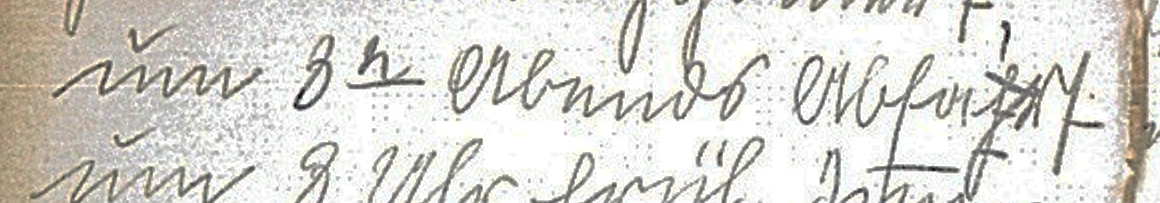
um 8h Abends Abends Abfahrt
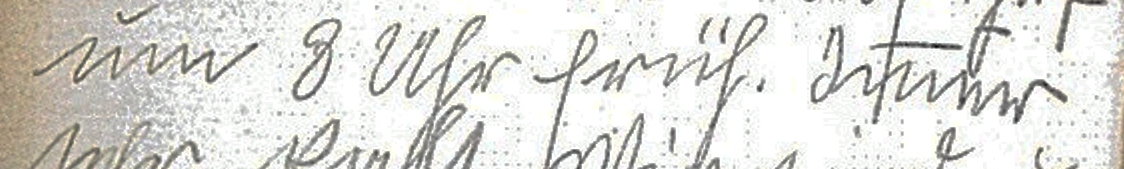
um 8 Uhr früh. Immer
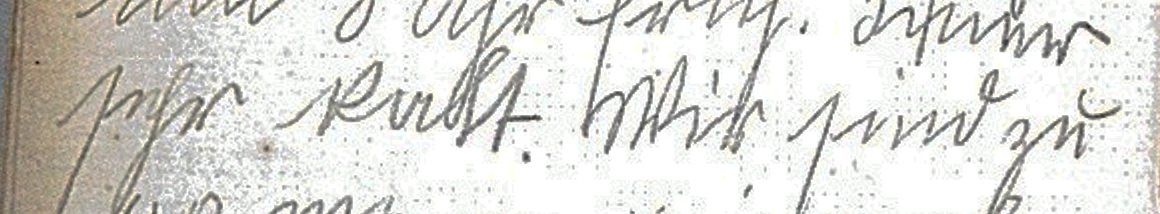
sehr kalt. Wir sind zu
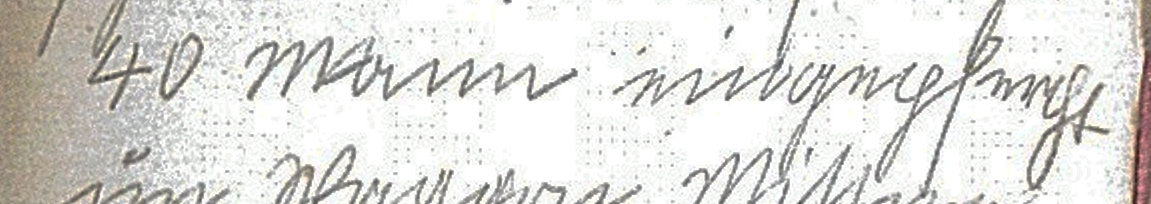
40 Mann eingepfercht
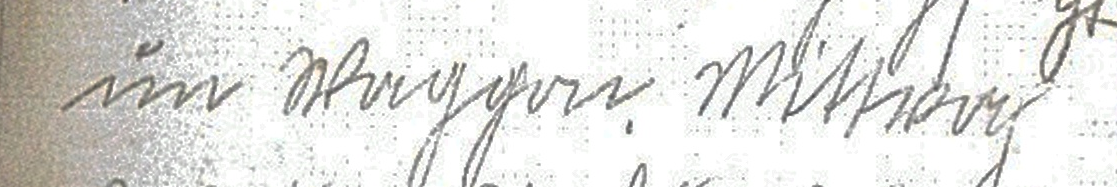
im Waggon Mlttwoch
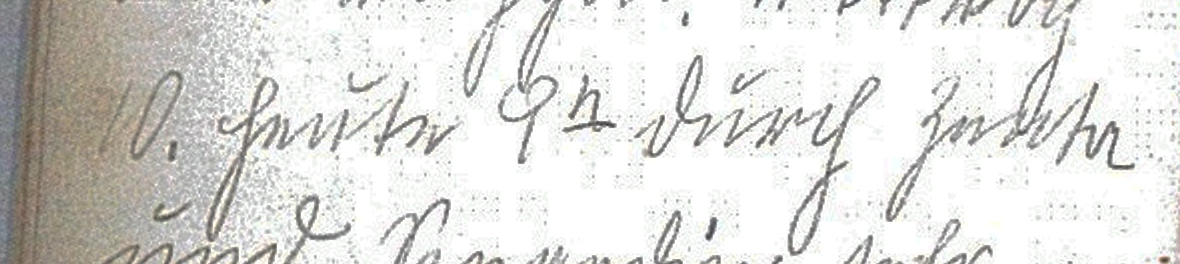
10. heute 9h durch Zento
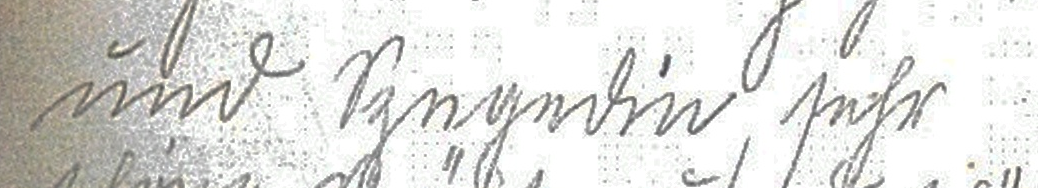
und Szegedin, sehr
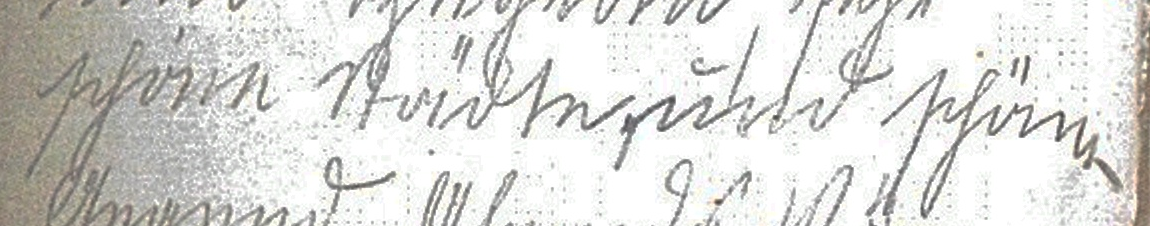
schöne Städte und schöne
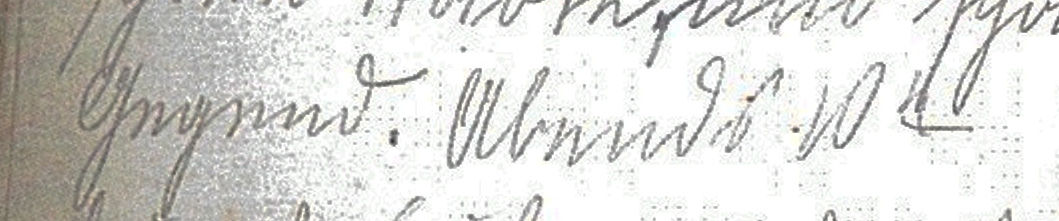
Gegend. Abends 10h
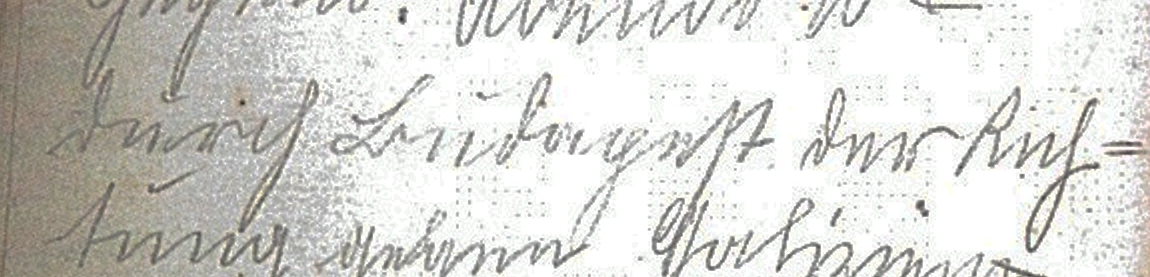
durch Budapest der Rich-
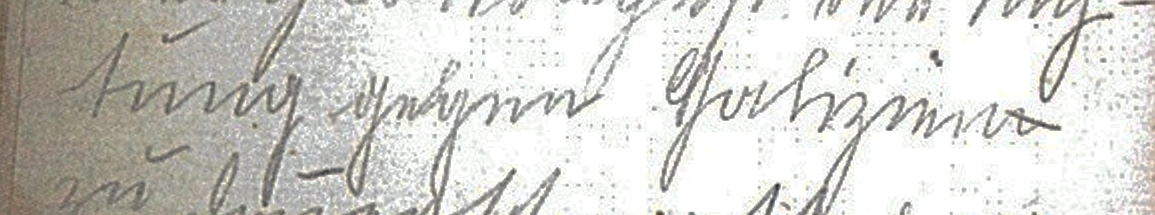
tund gegen Galizienn
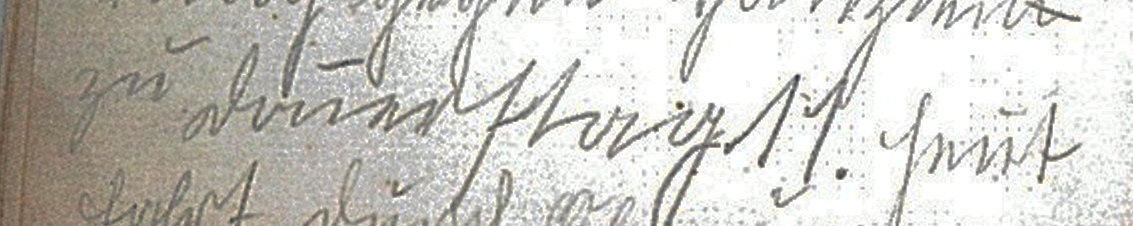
zu. Donnerstag 11. Heut
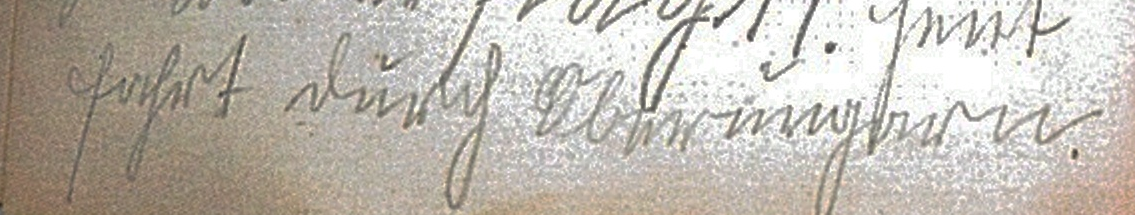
Fahrt durch Oberungarn.
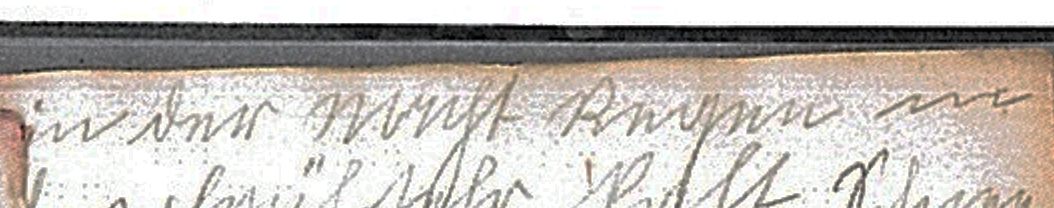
in der Nacht Regen in
